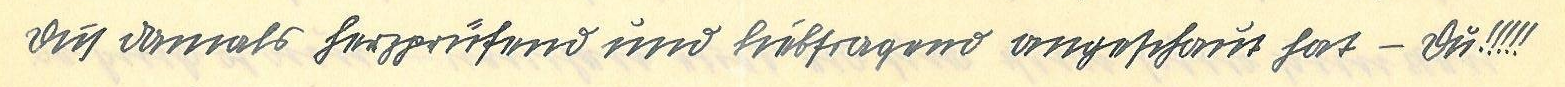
Dich damals herzprüfend und liebfragend angeschaut hat – Du!!!!!
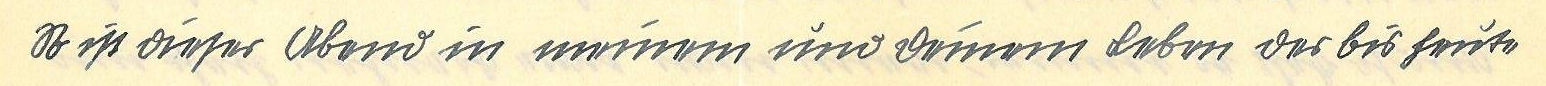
So ist dieser Abend in meinem und Deinem Leben der bis heute
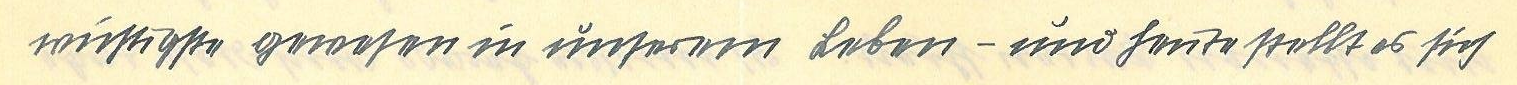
wichtigste gewesen in unserem Leben – und heute stellt es sich
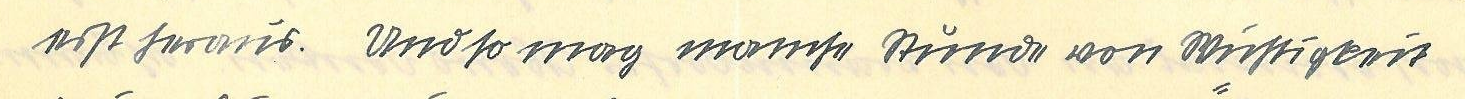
erst heraus. Und so mag manche Stunde von Wichtigkeit
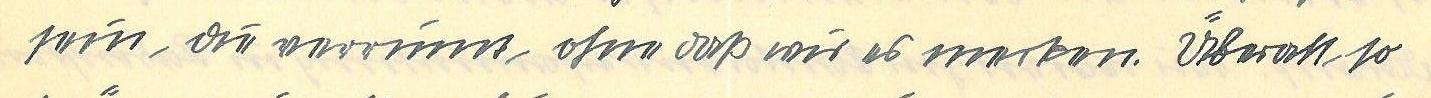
sein, die verrinnt, ohne daß wir es merken. Überall, so
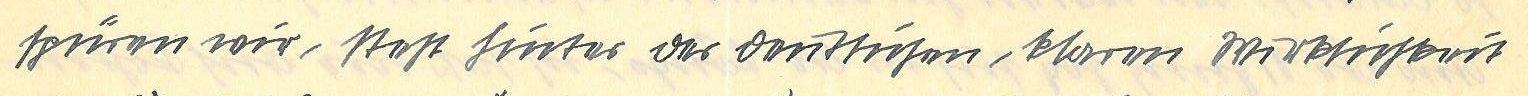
spüren wir, steht hinter der deutlichen, klaren Wirklichkeit
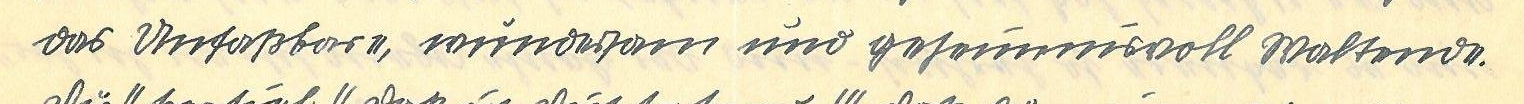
das Unfaßbare, wundersam und geheimnisvoll Waltende.
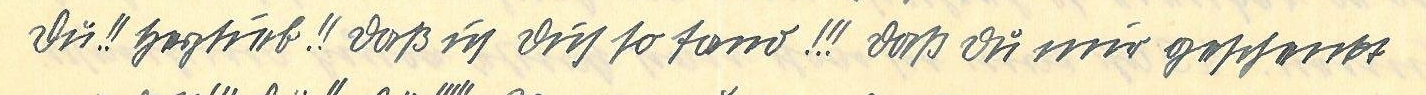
Du!! Herzlieb!! Daß ich Dich so fand!!! Daß Du mir geschenkt
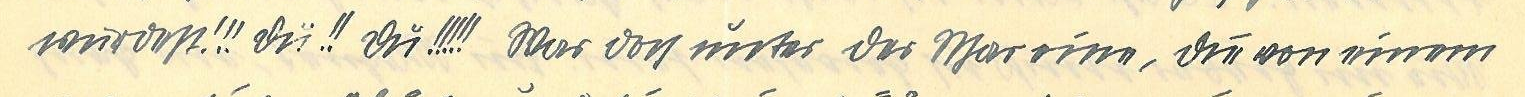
wurdest!!! Du!! Du!!!!! War doch unter der Schar eine, die von einem
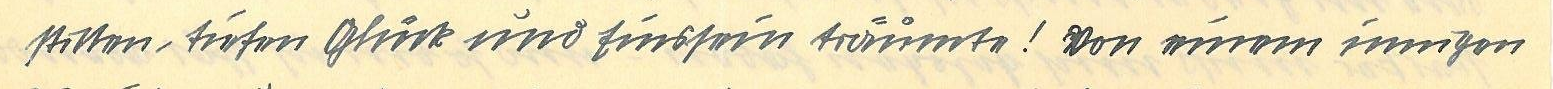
stillen, tiefen Glück und Einssein träumte! Von einem innigen
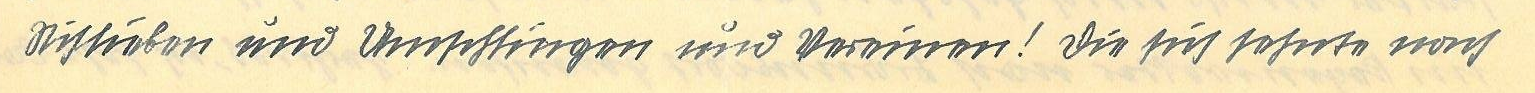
Sichlieben und Umschlingen und Vereinen! Die sich sehnte nach
